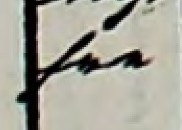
see
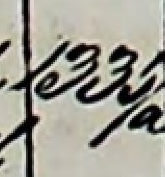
1335/a
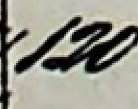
120
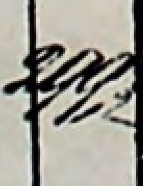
299,2
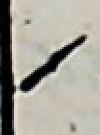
1
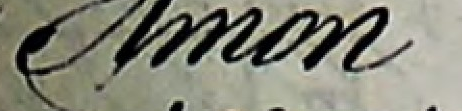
Amon
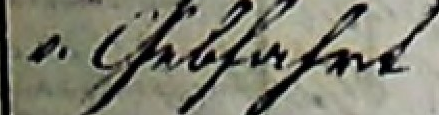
v. Gebfahrt
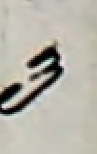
3
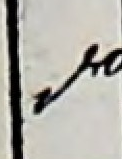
Do
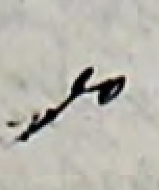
Do
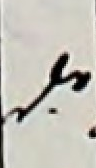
Do
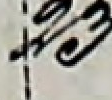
23
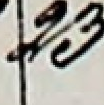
23
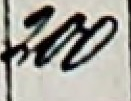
200
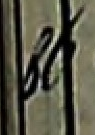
86
